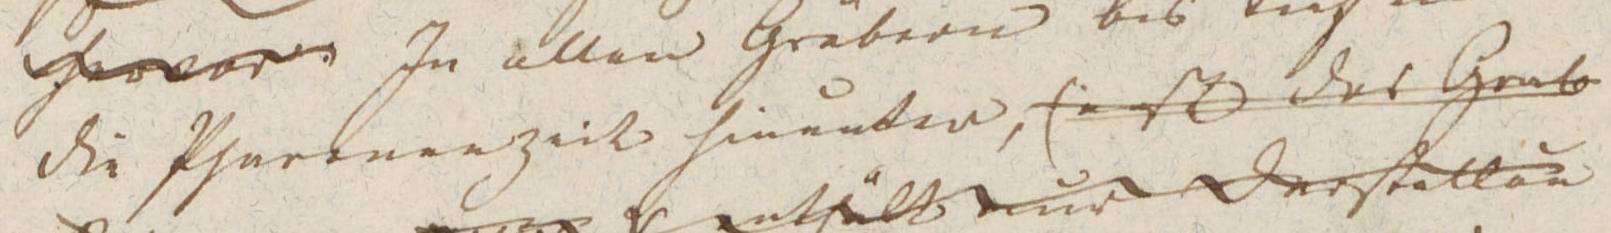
die Pharonenzeit hinunter, (erst das Grab
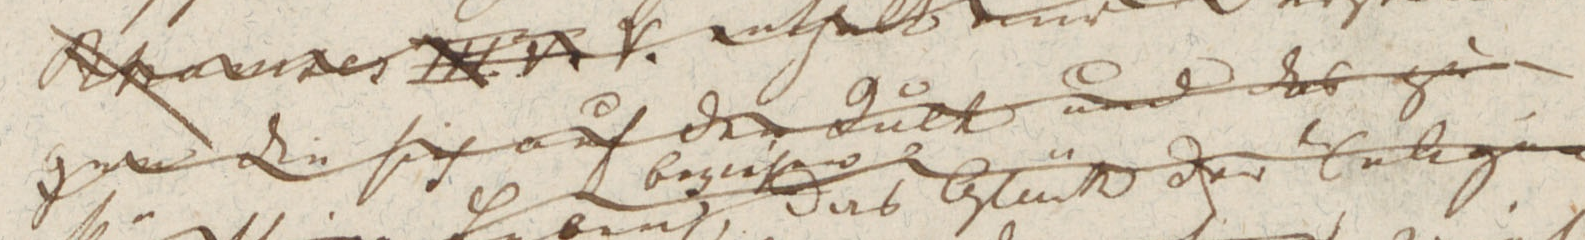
gen die sich auf den Kult und das zu-
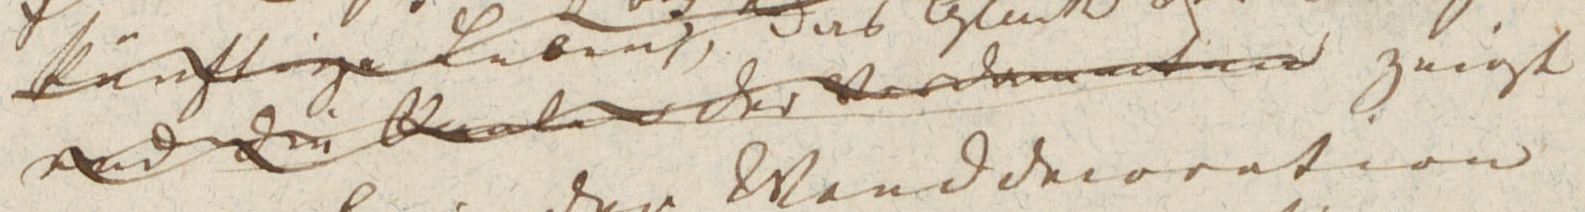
und die QUalen der Verwundeten zeigt
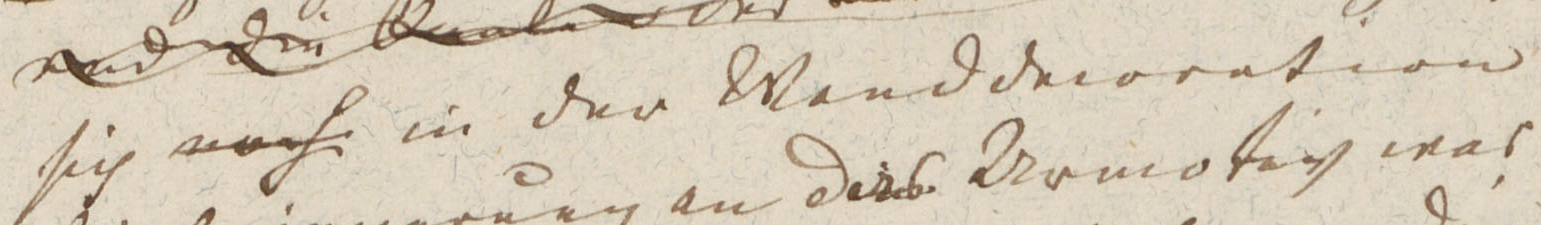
sich noch in der Wanddecoration
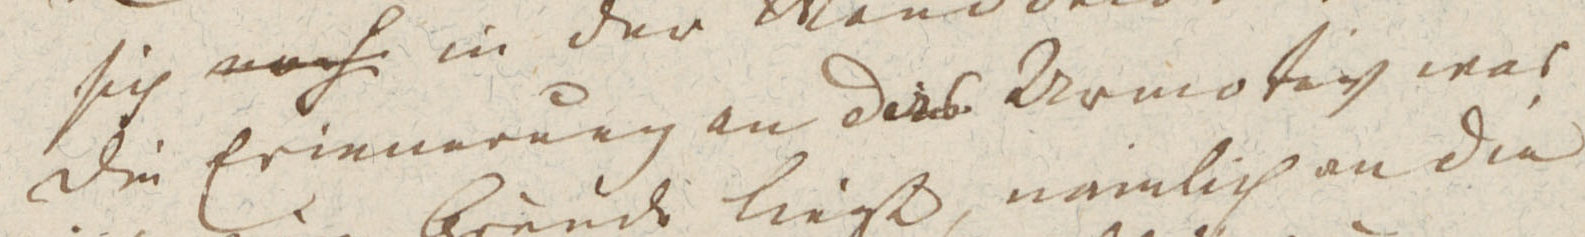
die Erinnerung an dieas Urmotiv was
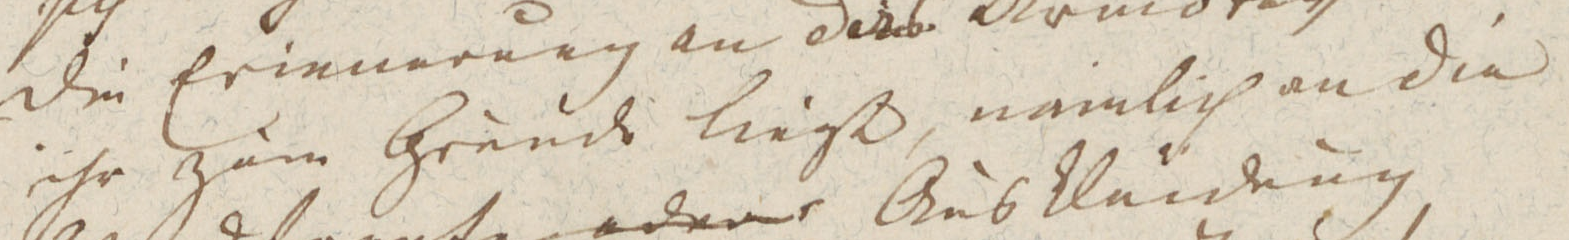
ihr zum Grunde liegt, nämlich an die
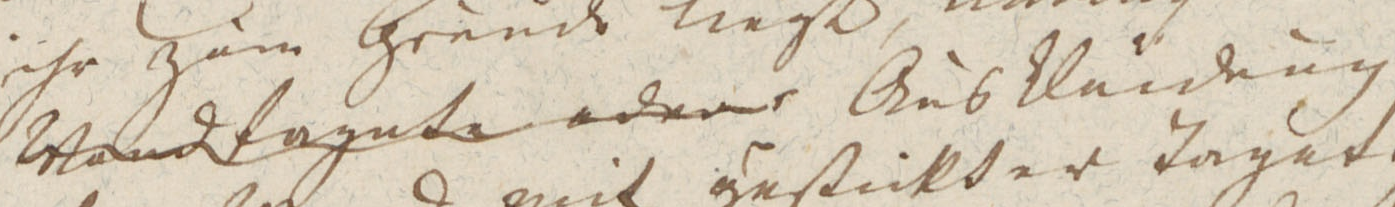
Wandtapete oder Auskleidung
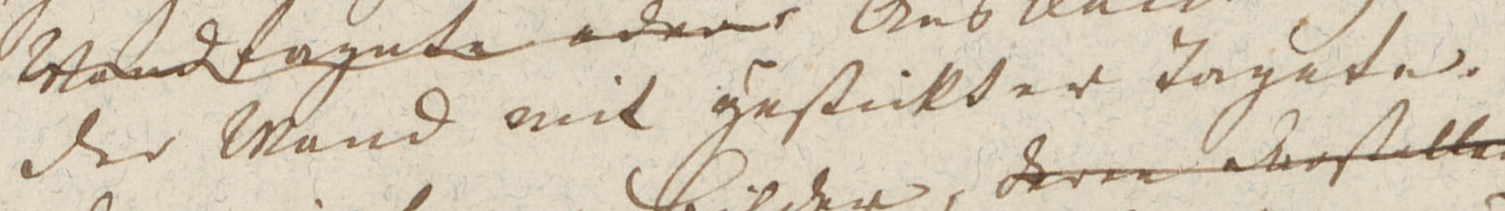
der Wand mit gestickter Tapete.
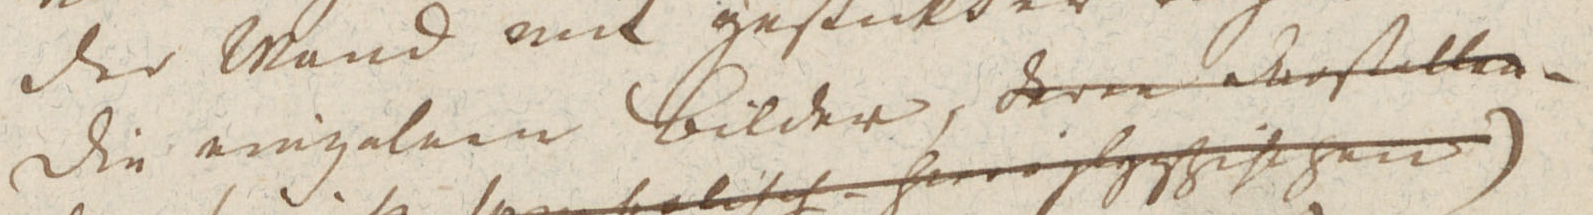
Die einzelnen Bilder, deren Darstellen-
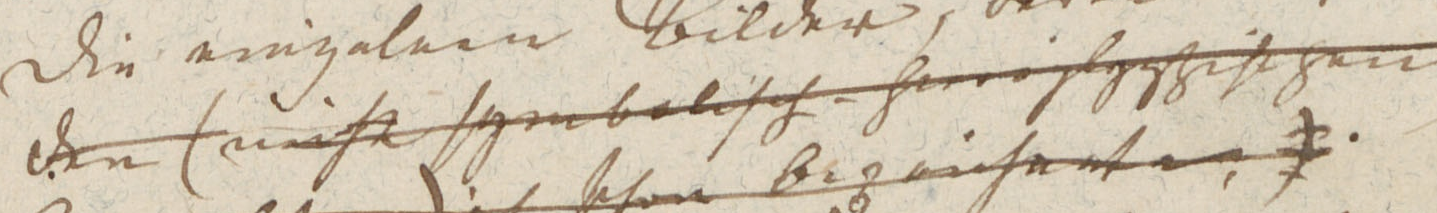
den (nicht symbolisch-hieroglyphischen)
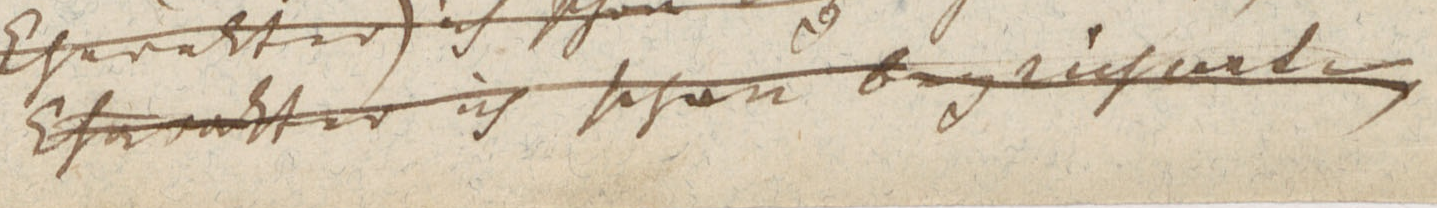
Charakter ich schon bezeichnete,
